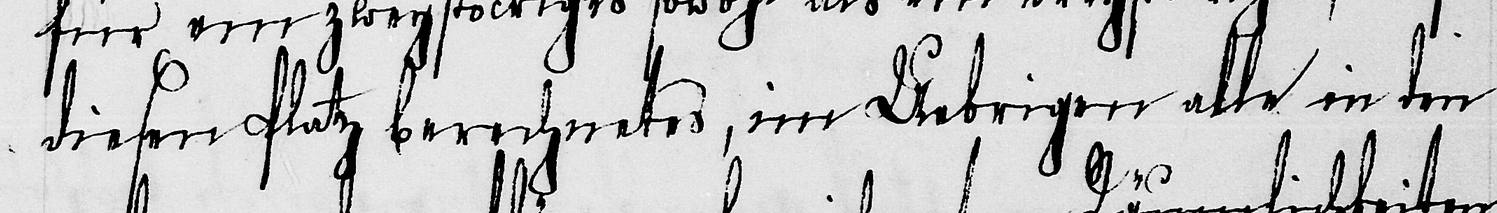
diesen Platz berechnetes, im Uebrigen alle in den
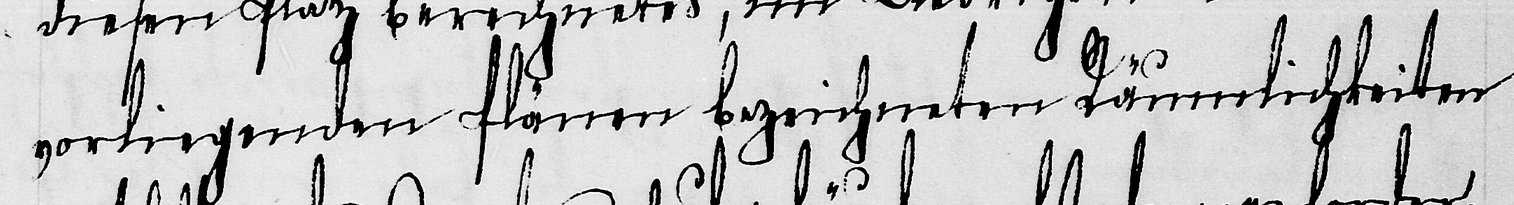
vorliegenden Plänen bezeichneten Räumlichkeiten
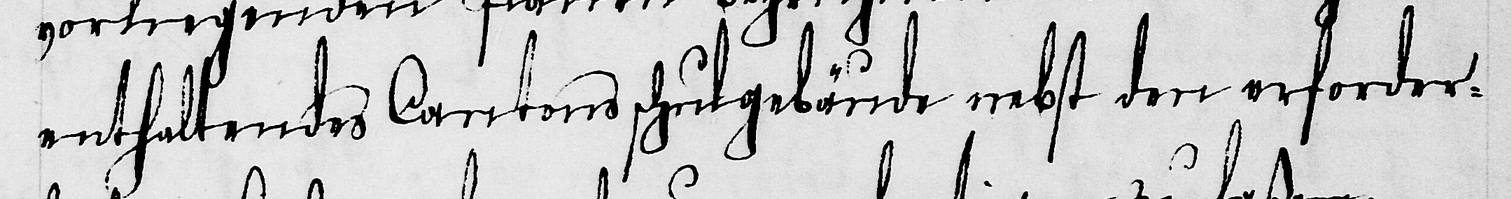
enthaltendes Cantonsschulgebäude nebst den erforder¬
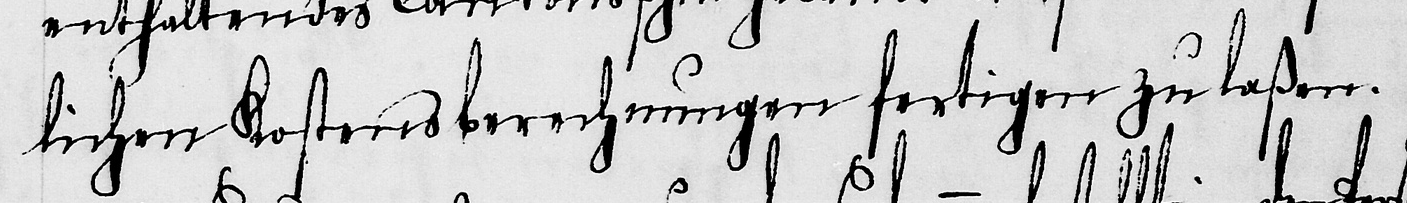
lichen Kostensberechnungen fertigen zu laßen.
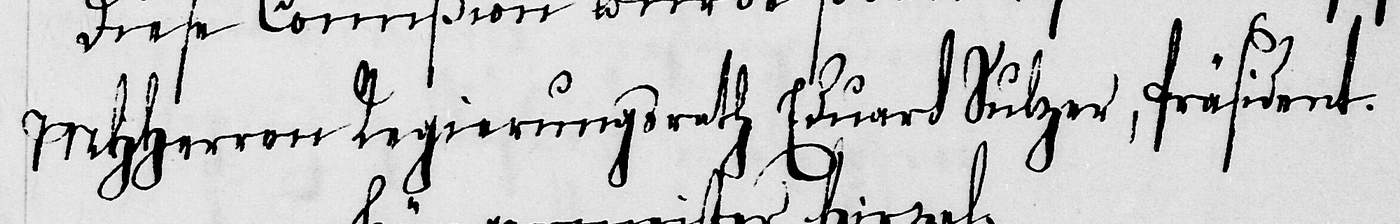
MHHerren Regierungsrath Eduard Sulzer, Präsident.
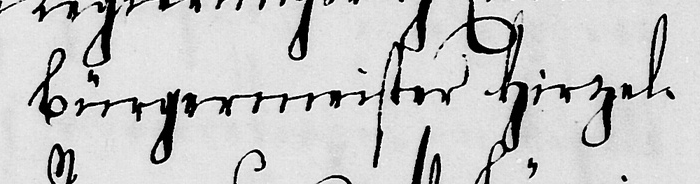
Bürgermeister Hirzel.
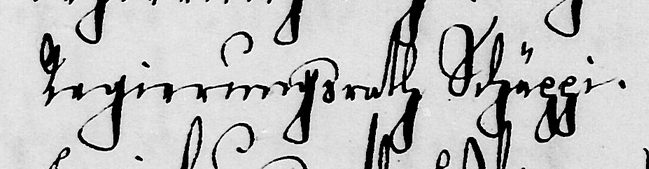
Regierungsrath Schäppi.
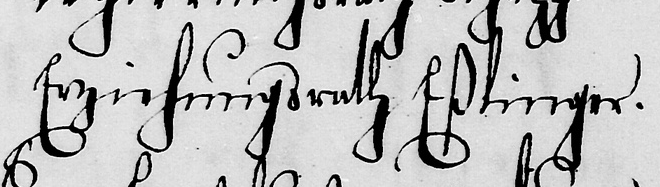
Erziehungsrath Esslinger.
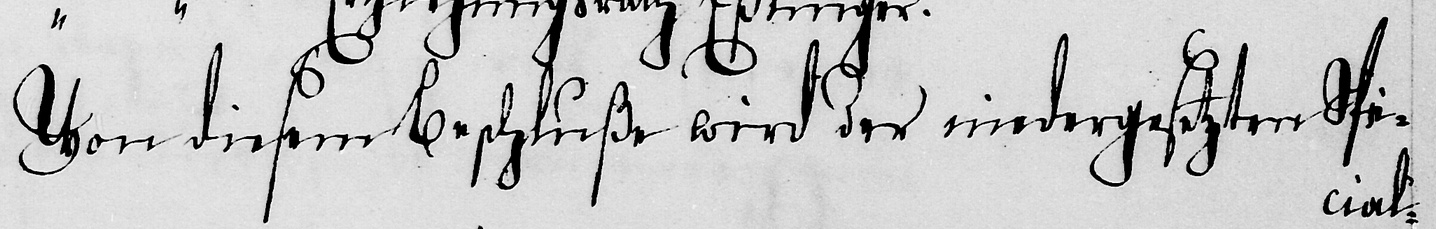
Von diesem Beschlusse wird der niedergesetzten
